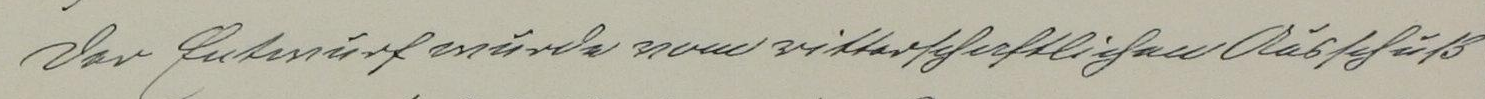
Der Entwurf wurde vom ritterschaftlichen Ausschuß
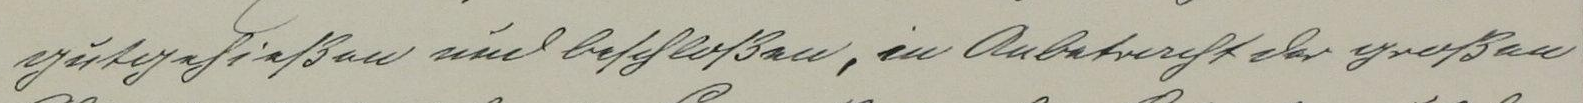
gutgeheißen und beschloßen, in Anbetracht der großen
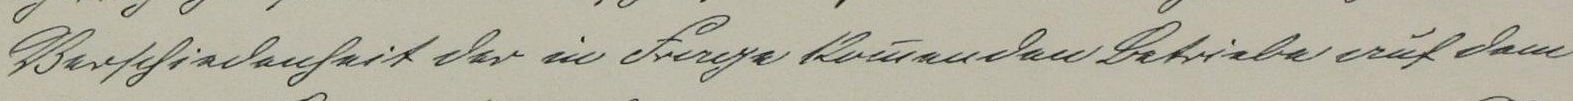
Verschiedenheit der in Frage kommenden Betriebe auf dem
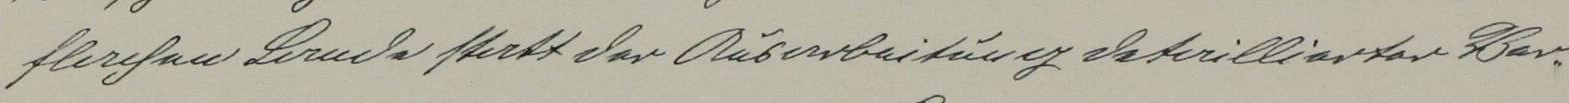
flachen Lande statt der Ausarbeitung detaillierter Ver-
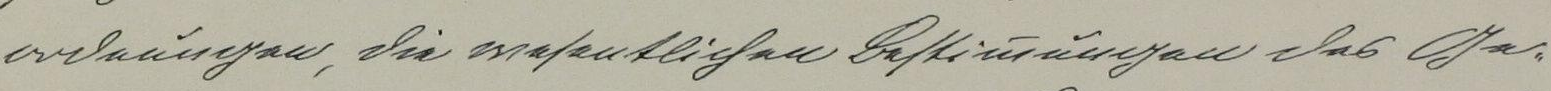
ordnungen, die wesentlichen Bestimmungen des Ge-
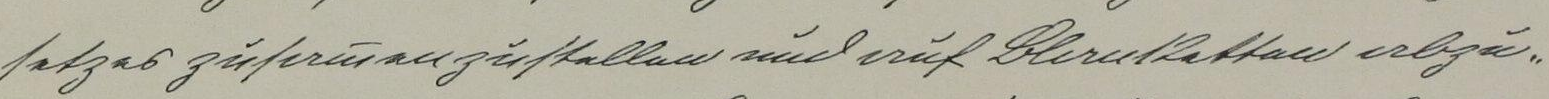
setzes zusammenzustellen und auf Blanketten abzu-
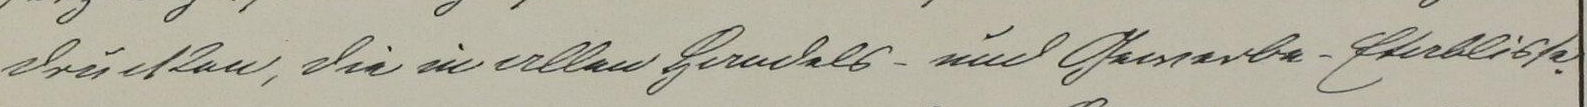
drucken, die in allen Handels- und Gewerbe-Etablisse-
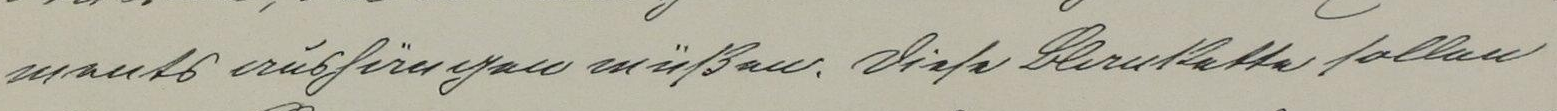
ments aushängen müßen. Diese Blankette sollen
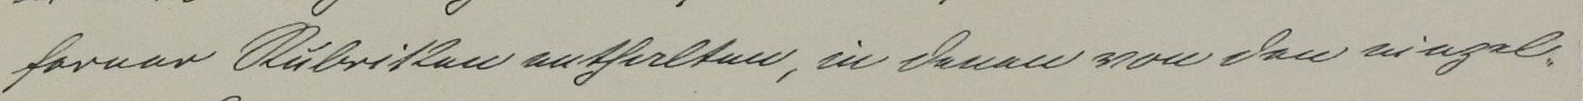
ferner Rubriken enthalten, in denen von den einzel-
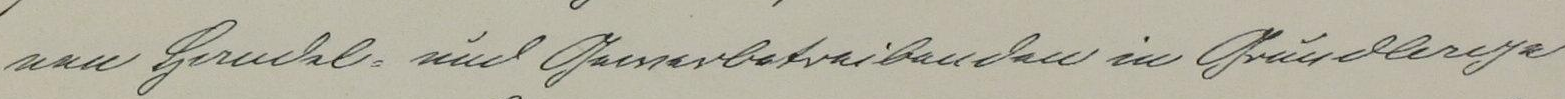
nen Handel- und Gewerbetreibenden in Grundlage
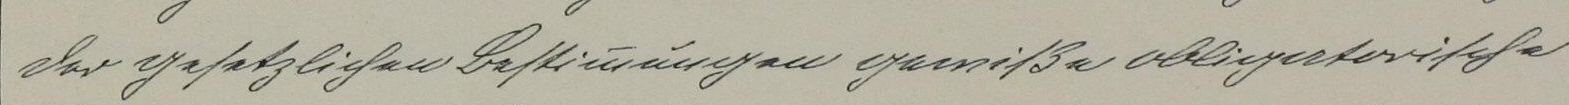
der gesetzlichen Bestimmungen gewiße obligatorische
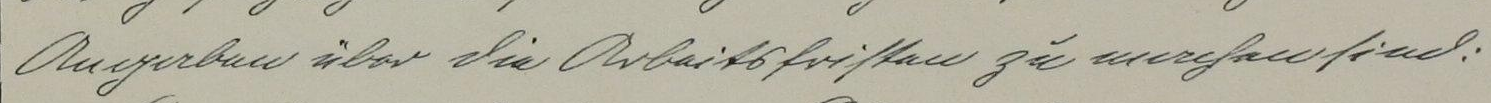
Angaben über die Arbeitsfristen zu machen sind:
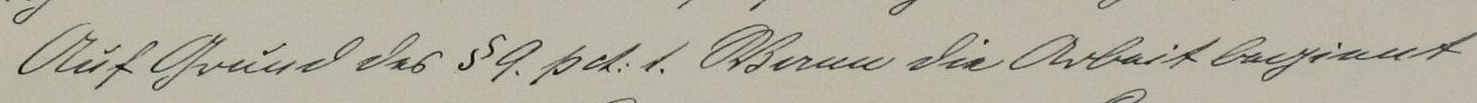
Auf Grund des § 9. pct. 1. Wann die Arbeit beginnt
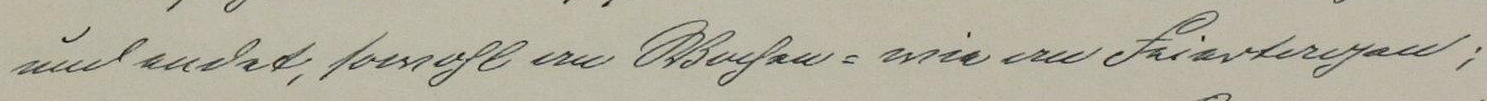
und endet, sowohl an Wochen- wie an Feiertagen;
